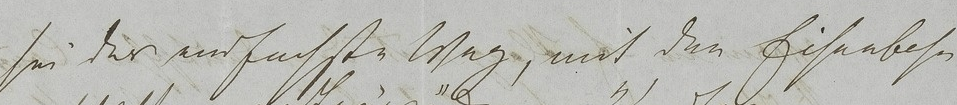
sei der einfachste Weg, mit den Eisenbahn-
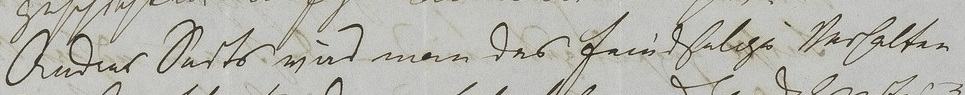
Andrer Seits wird man das feindselige Verhalten
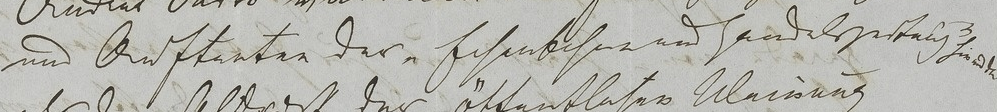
und Auftreten der «Eisenbahn- und Handelszeitung» hie
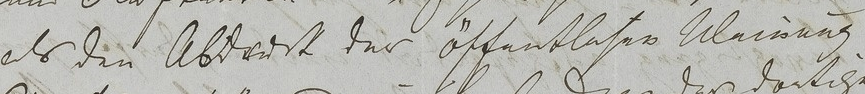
als den Abdruck der öffentlichen Meinung
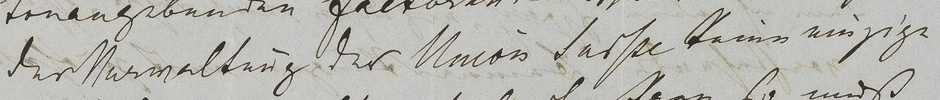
der Verwaltung der Union Suisse keine einzige
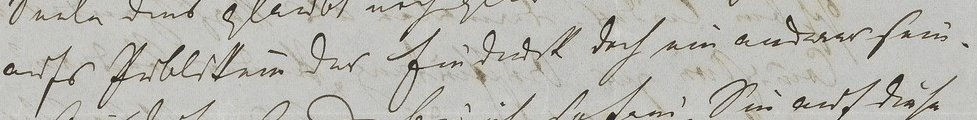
aufs Publikum der Eindruck doch ein anderer sein.
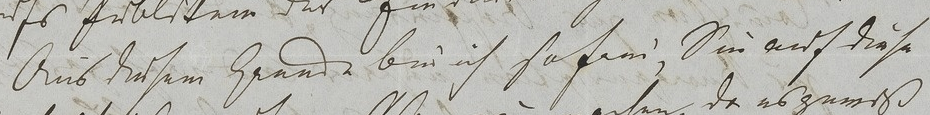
Aus diesem Grunde bin ich so frei, Sie auf diese
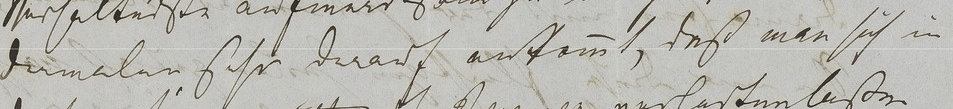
dermalen sehr darauf ankommt, daß man sich in
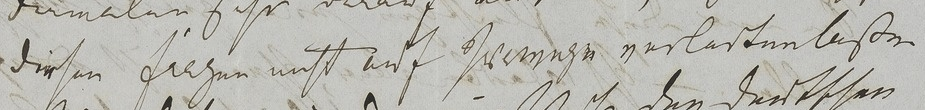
diesen Fragen nicht auf Irrwege verleiten laße.
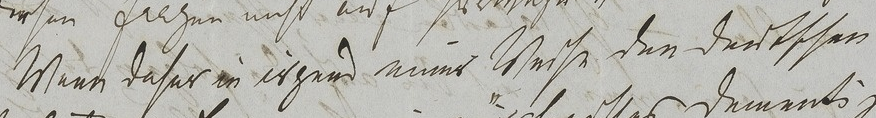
Wenn daher in irgend einer Weise den deutschen
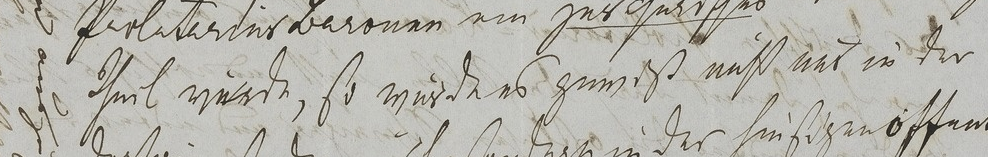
Theil würde, so würde es gewiß nicht nur in der
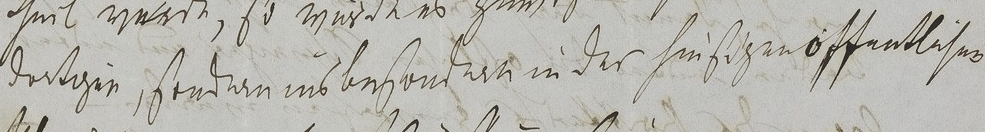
dortigen, sondern insbesondere in der hiesigen öffentlichen
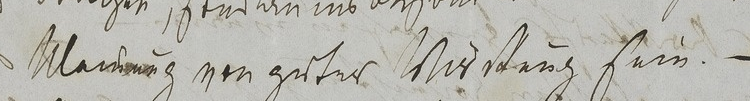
Meinung von guter Wirkung sein. –
